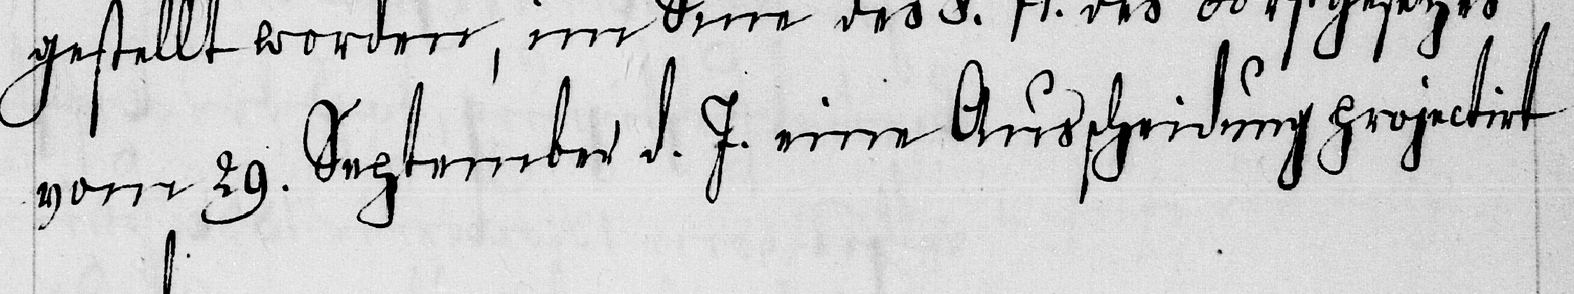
vom 29. September d. J. eine Ausscheidung projectirt
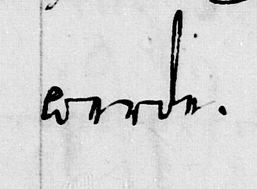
werde.
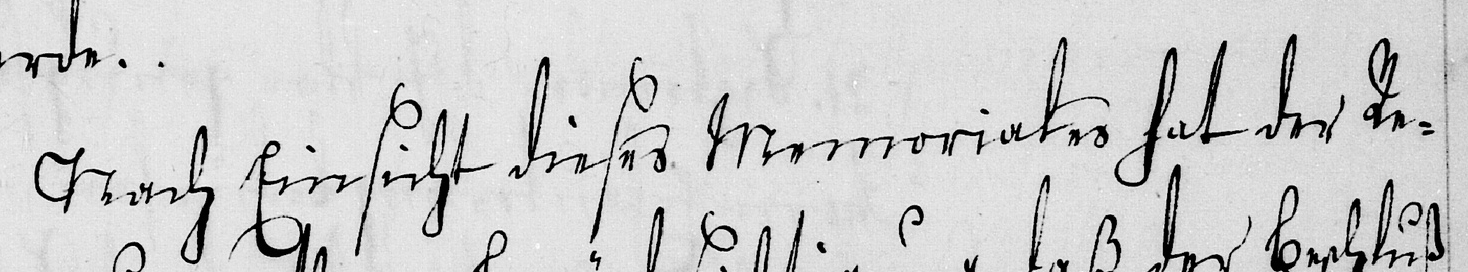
Nach Einsicht dieses Memoriales hat der Re¬
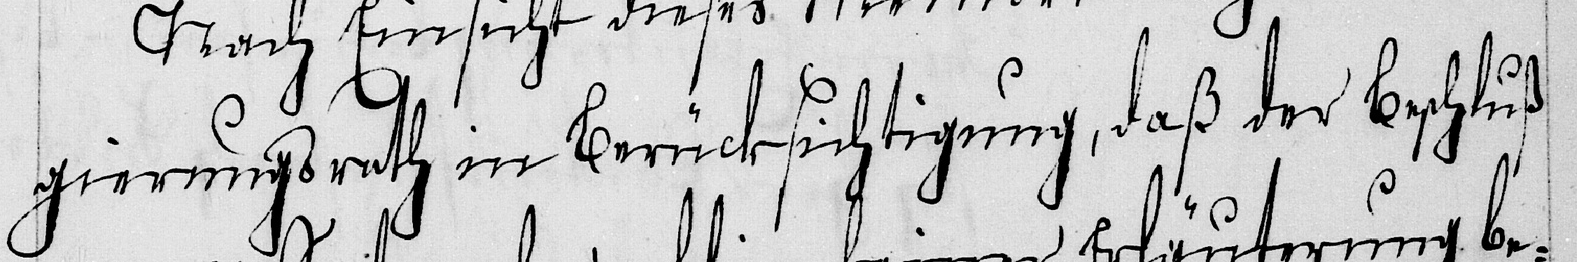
gierungsrath in Berücksichtigung, daß der Beschluß
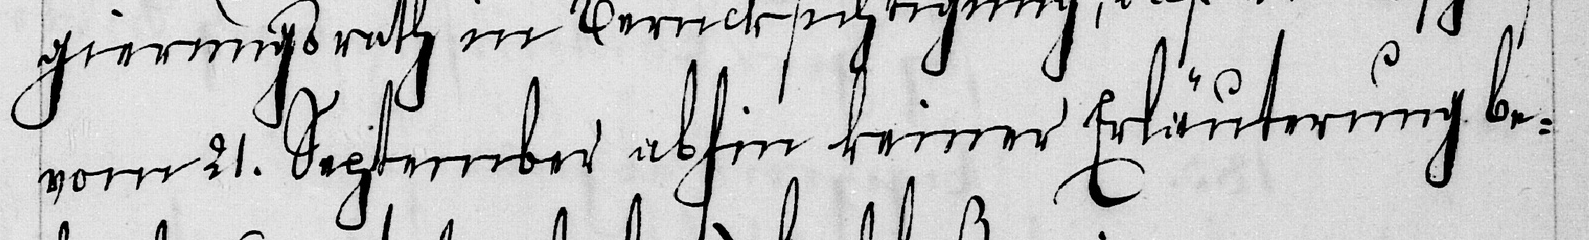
vom 21. September abhin keiner Erläuterung be¬
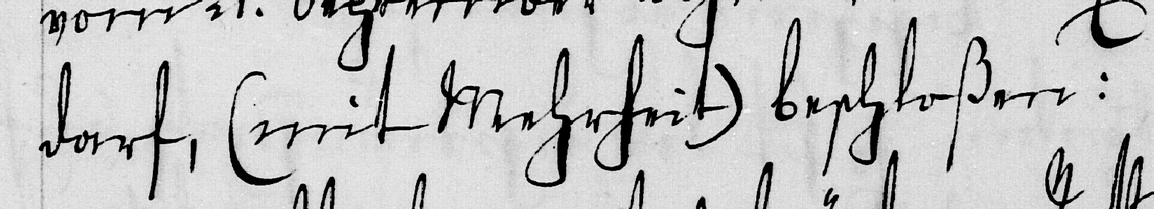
darf, (mit Mehrheit) beschloßen:
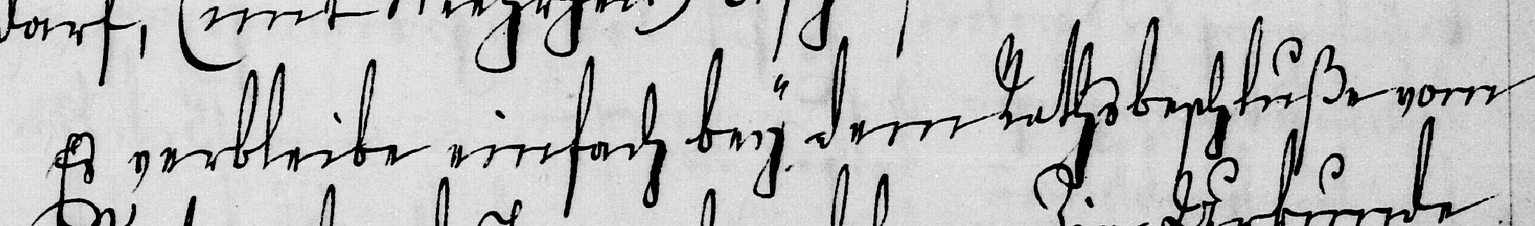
Es verbleibe einfach bey dem Rechtsbeschluße vom
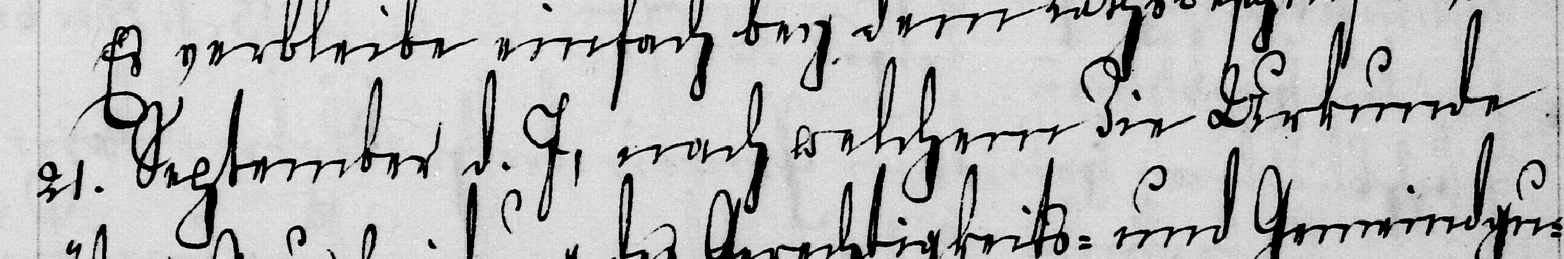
21. September d. J, nach welchem die Urkunde
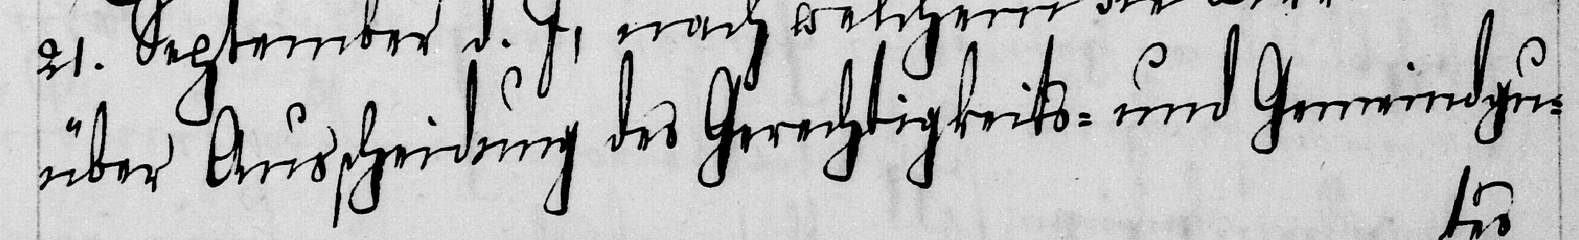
über Ausscheidung des Gerechtigkeits- und Gemeindgu-
